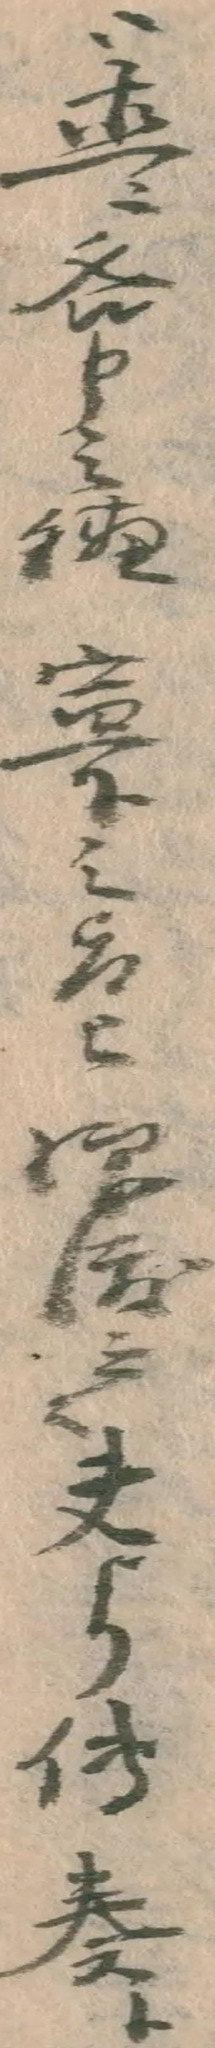御直に各申之儘宣下之旨被仰渡云々夫より傳奏ト
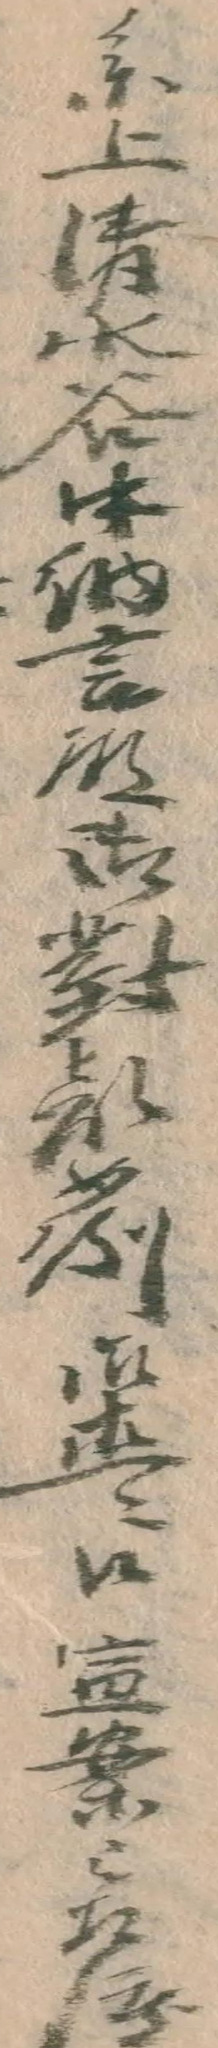参上清水谷中納言殿御對顔如例御直々口宣案被相渡
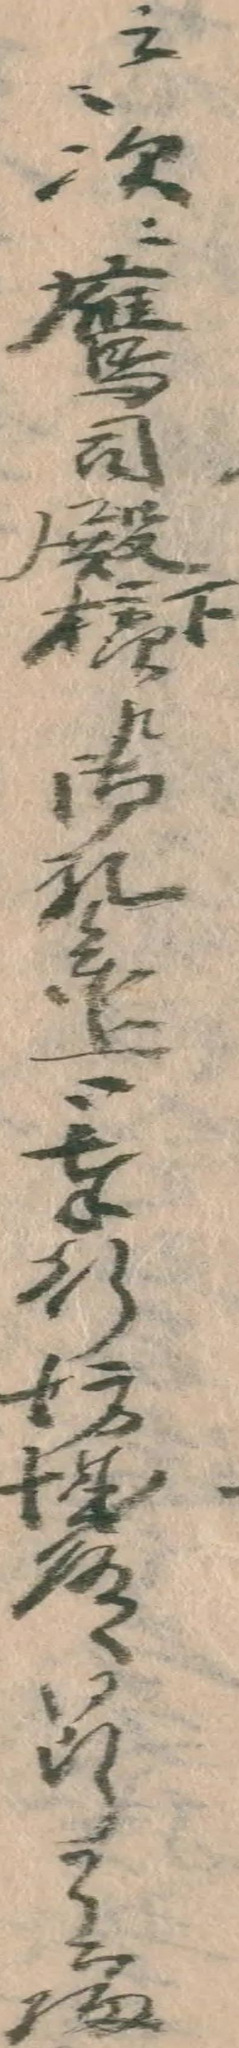云々次に鷹司殿下橋え御礼参上御奉行坊城殿へ同断了而帰
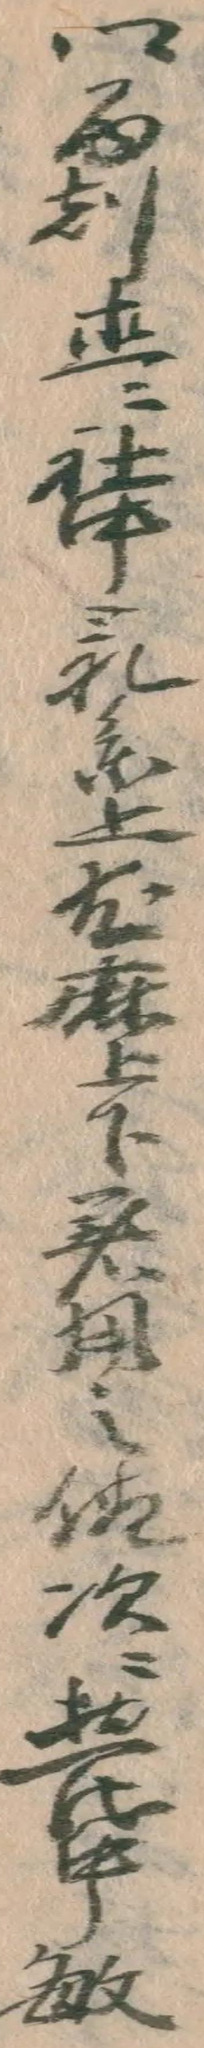郷酉刻直に社中御礼参上尤麻上下着用之儘次に惣代中敏
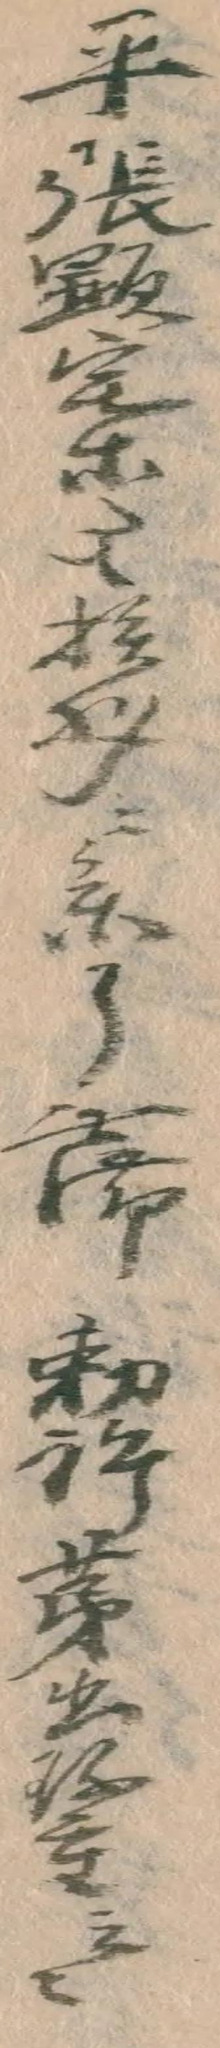平張顕宅等へも挨拶ニ参了無滞勅許芽出珍重云々
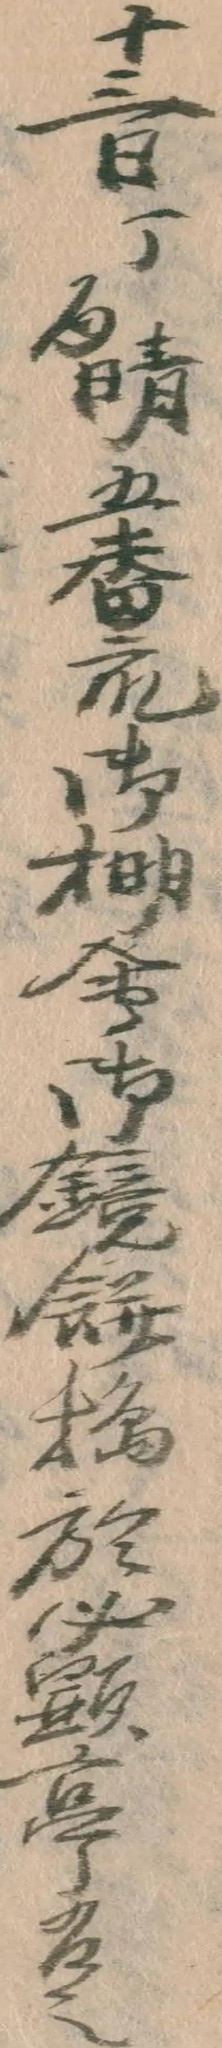十三日丁酉晴五番衆御棚會御鏡餅搗於必顕亭有之
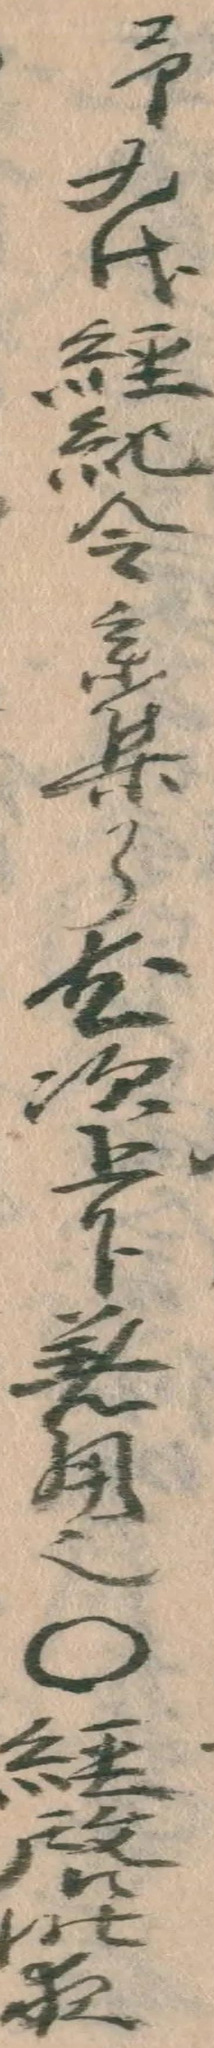予為代経紀令参集了尤次上下着用也○経啓候昨夜
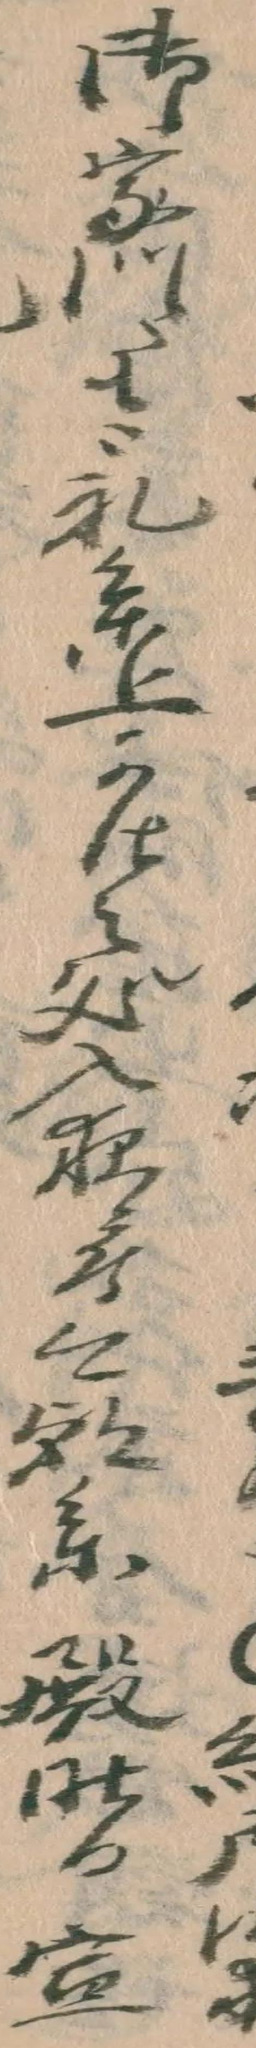御家門へも御礼参上可仕之処入夜ニ付今朝参殿昨日宜
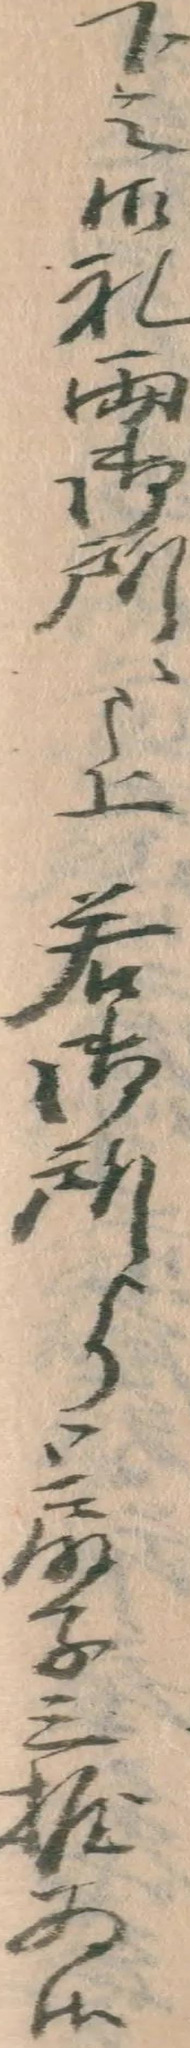下之御礼両御所へ申上若御所より御扇子三握為御
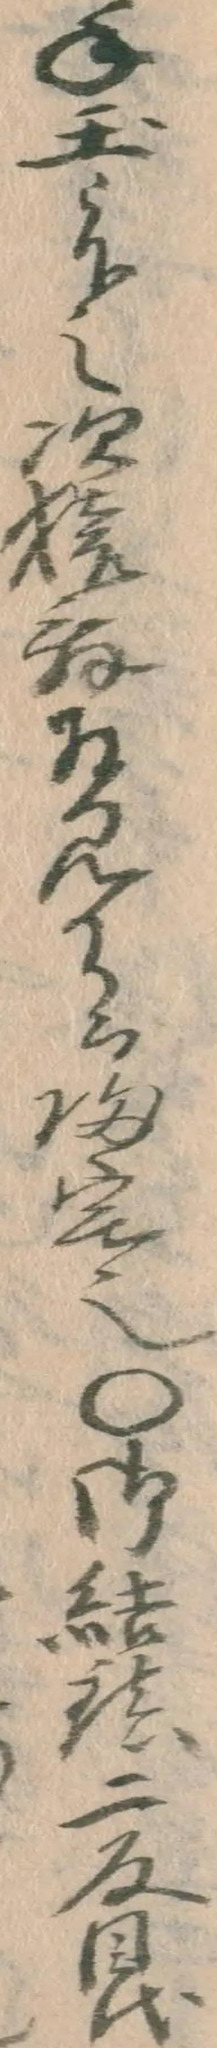年玉被下也次猿舞拝見了而帰宅也○御結鎮二反目代
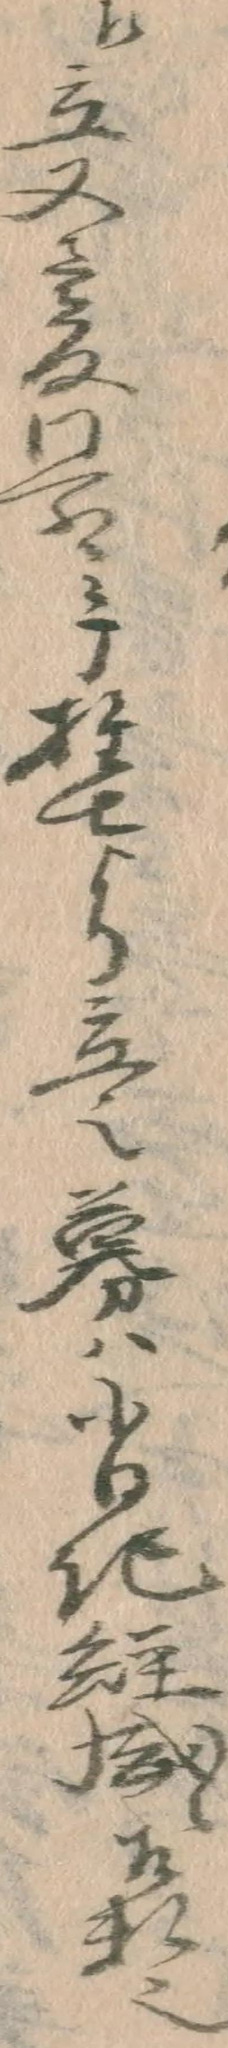え立又壱反同所ニテ権七より立之募ハ小日記経威相頼也
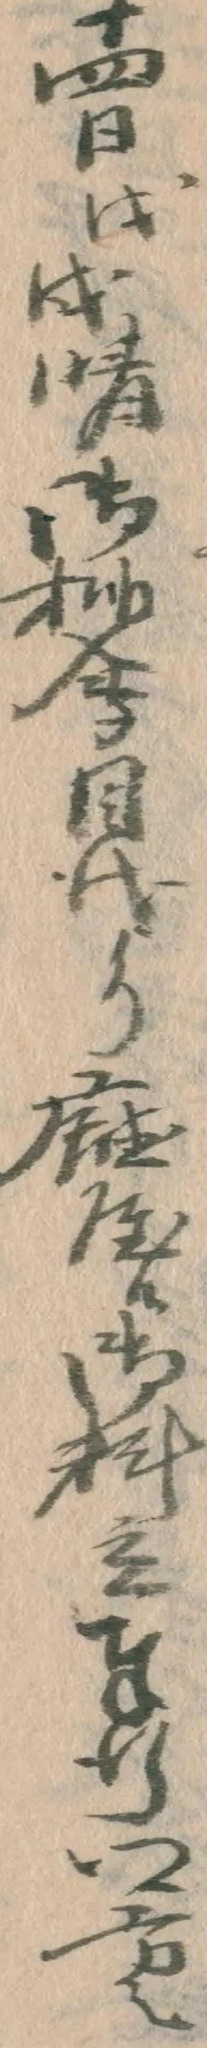十四日戊戌晴御棚會目代より廰屋え御料立奉行郷方之
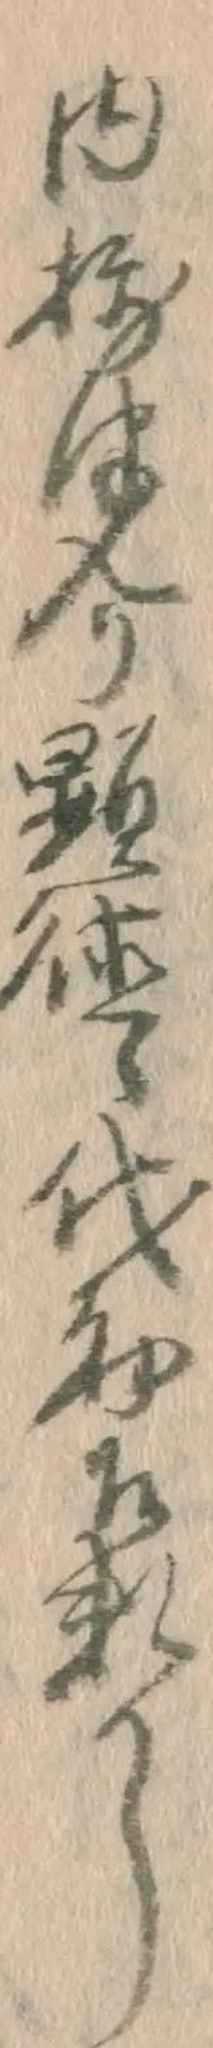内摂津入り顕徳ニ代勤相頼了
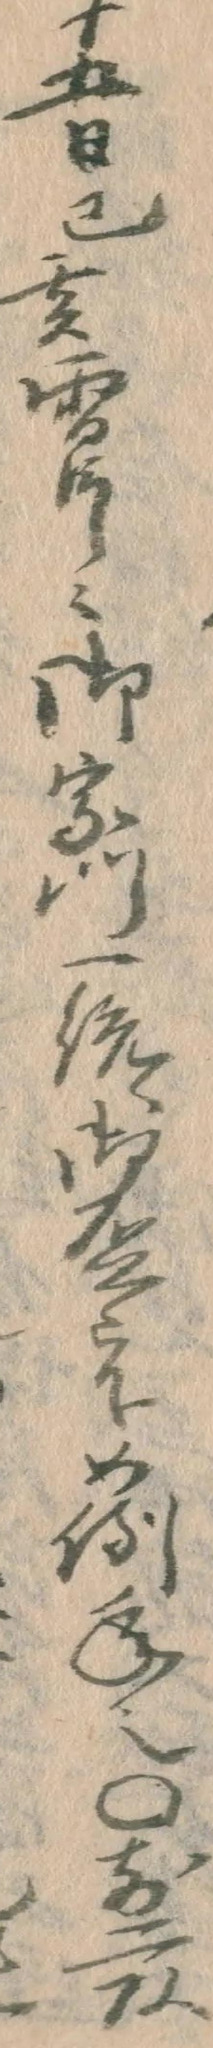十五日己亥雪時々御家門一統へ御盃被下如例年也○前二頭
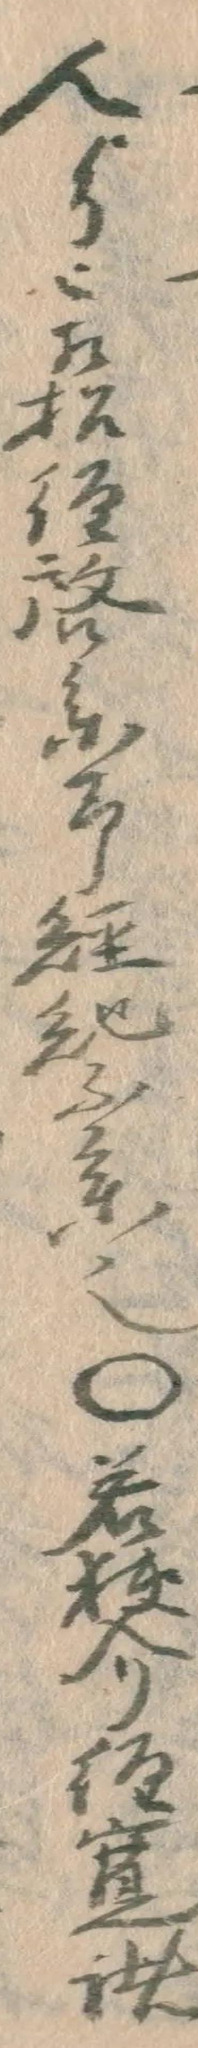人より被相招経啓参候事経紀不参也○若狭介経覚諸
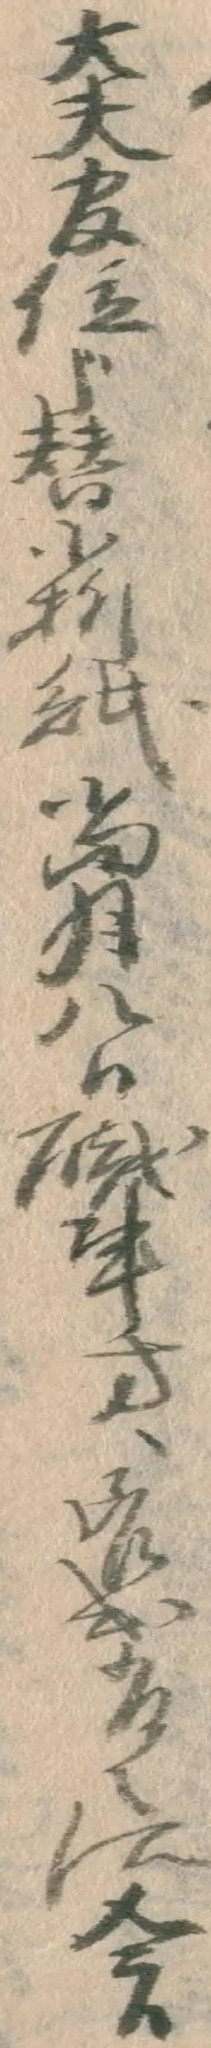大夫官位申替小折紙當月八日職事方へ差出有之次今日
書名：賀茂社記録. 第67冊
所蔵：国立国会図書館 National Diet Library, JAPAN
